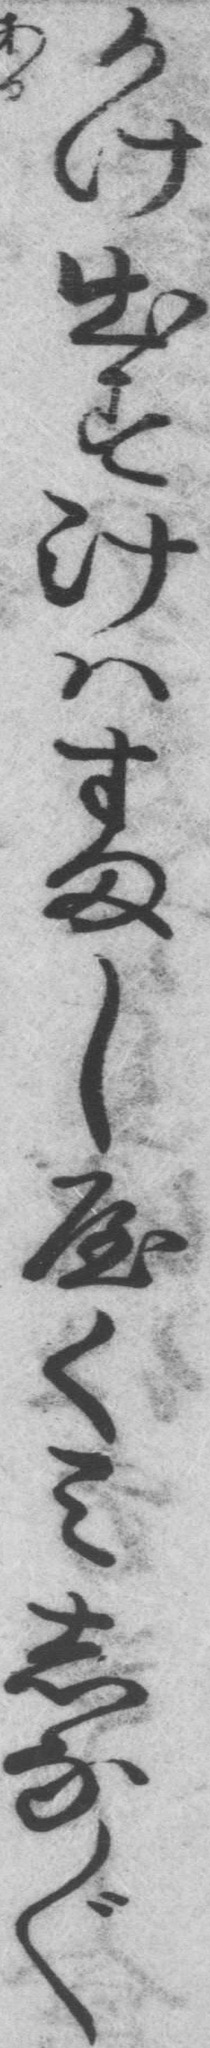かけ出春汁はすまし屋くみ志な〴〵
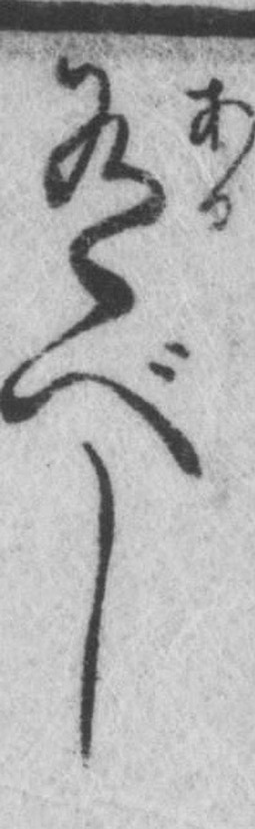有べし
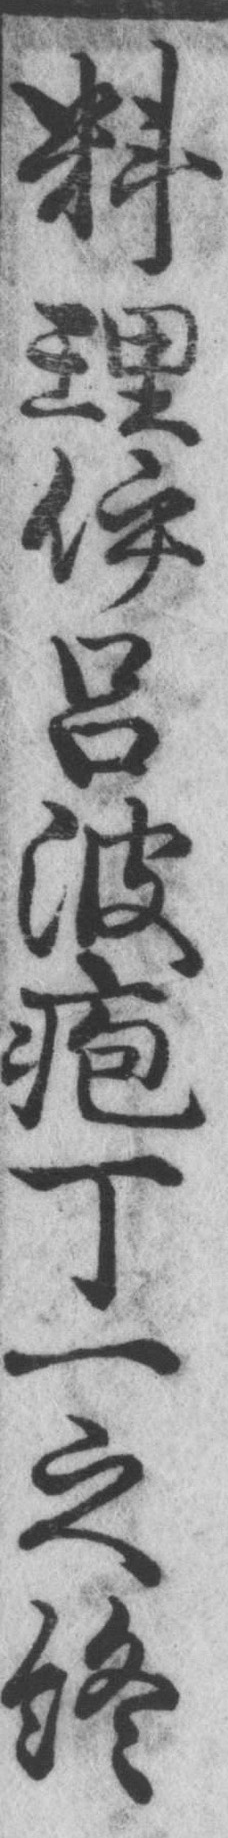料理伊呂波庖丁一之終

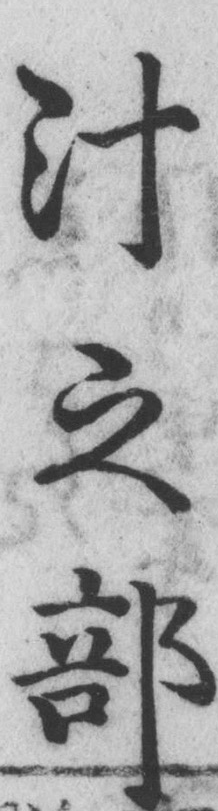汁之部

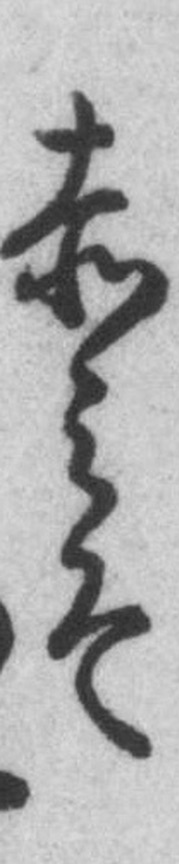赤みそ
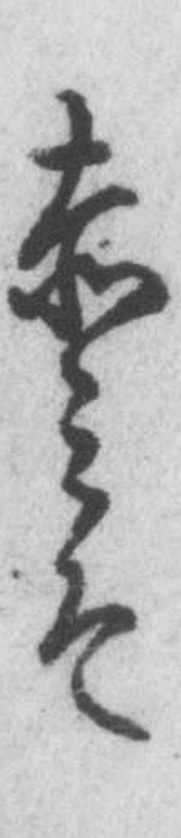赤みそ
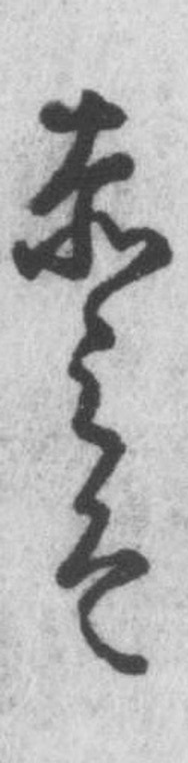赤みそ
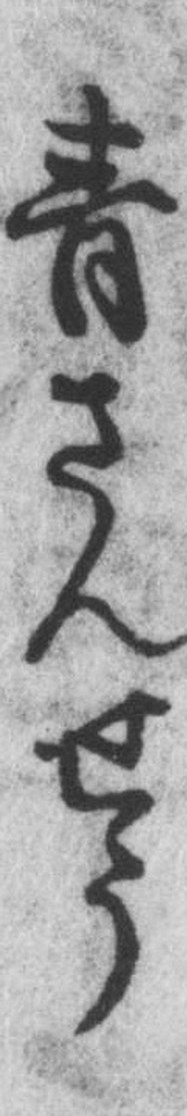青さんせう
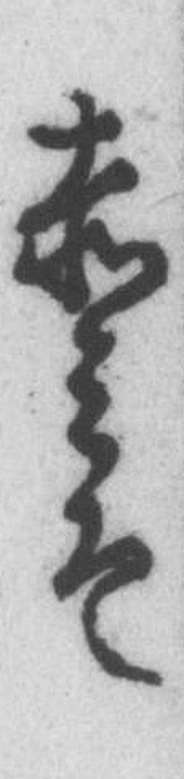赤みそ
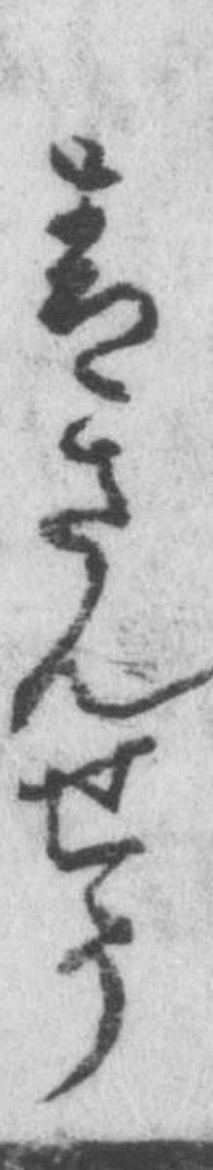青さんせう
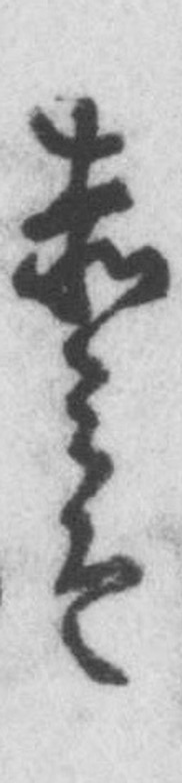赤みそ

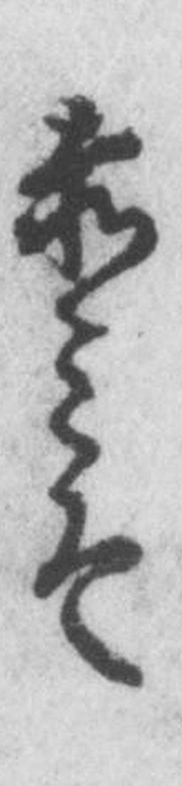赤みそ
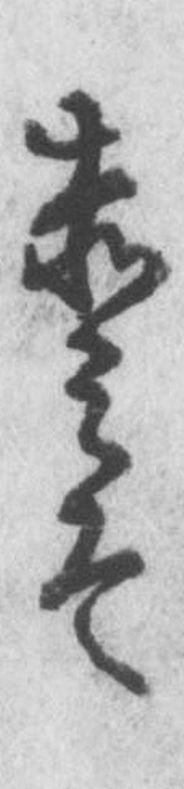赤みそ
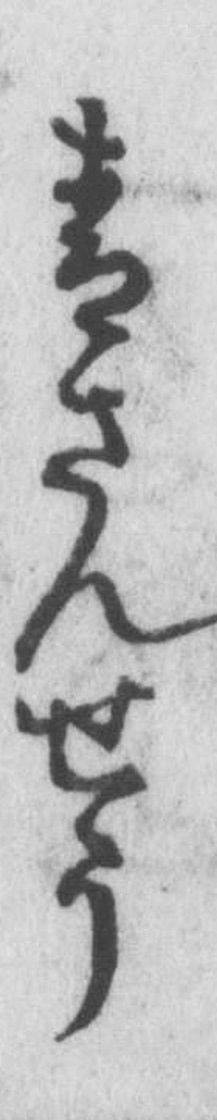青さんせう
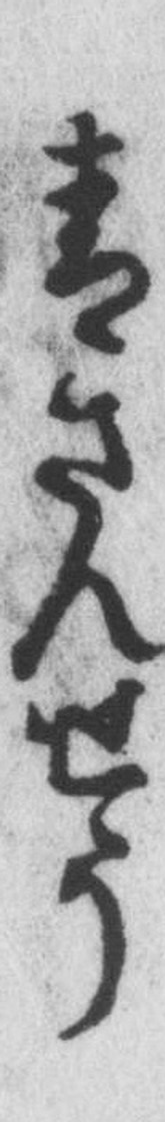青さんせう
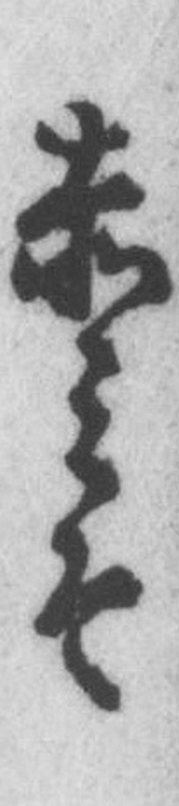赤みそ
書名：料理伊呂波庖丁
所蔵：大阪府立大学学術情報センター 国文学研究資料館
